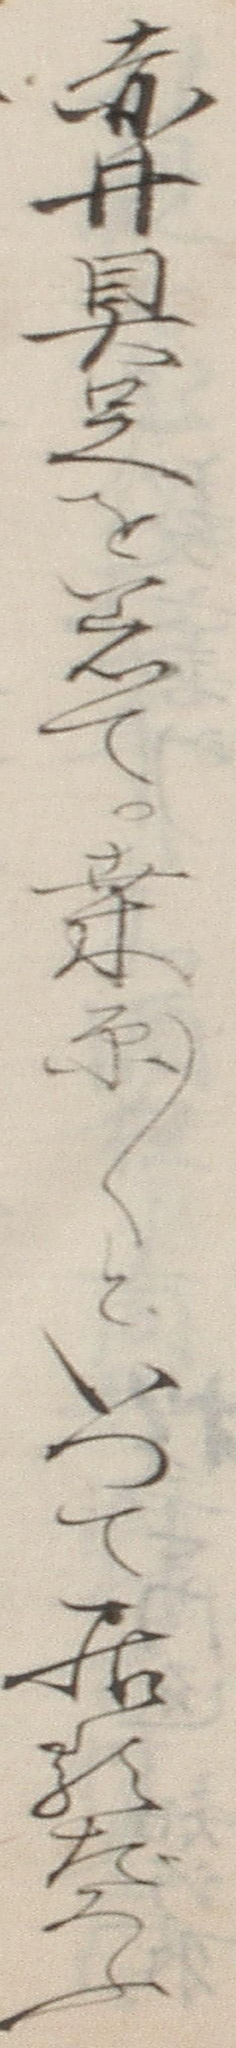赤井具足を着て。桑原〳〵といつて居るだろふ
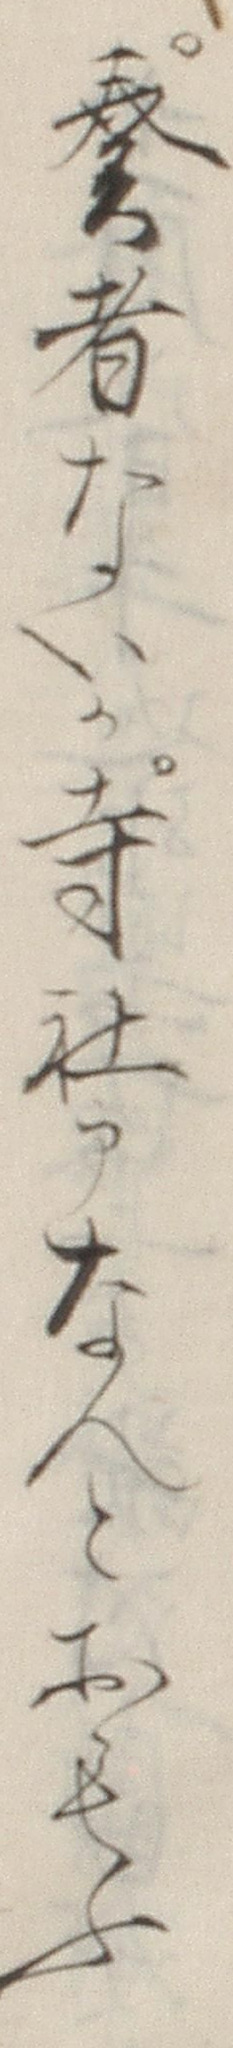奏者ないか。寺社アなんとおもふ
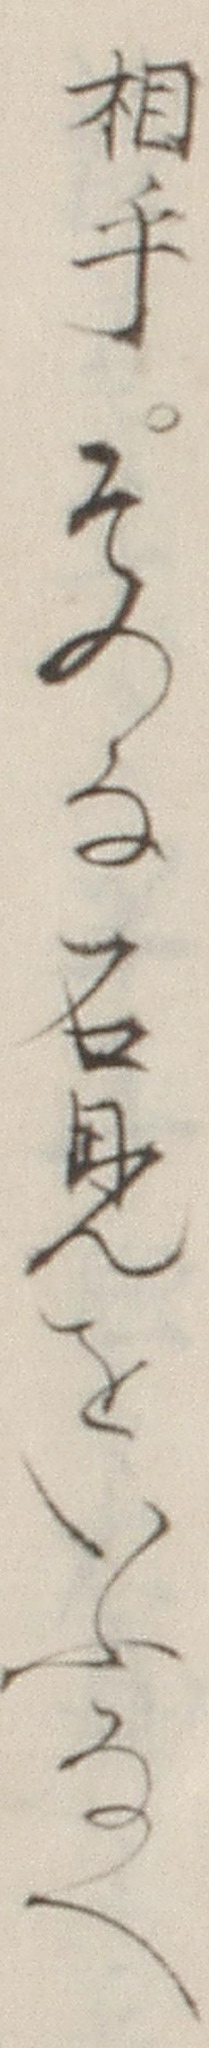相手。そのな石見をいふなへ
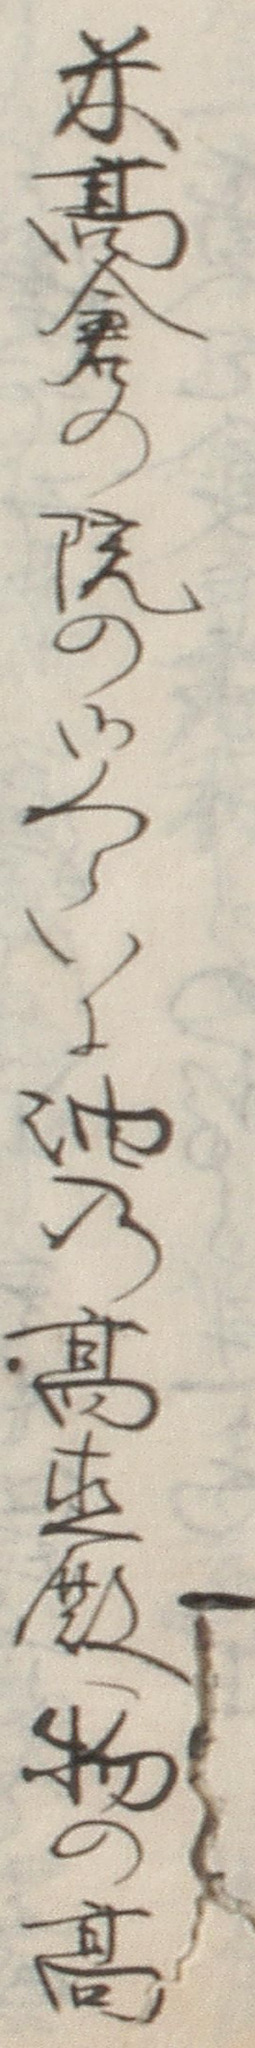米高倉の院の御くらいに油の高直殿物の高
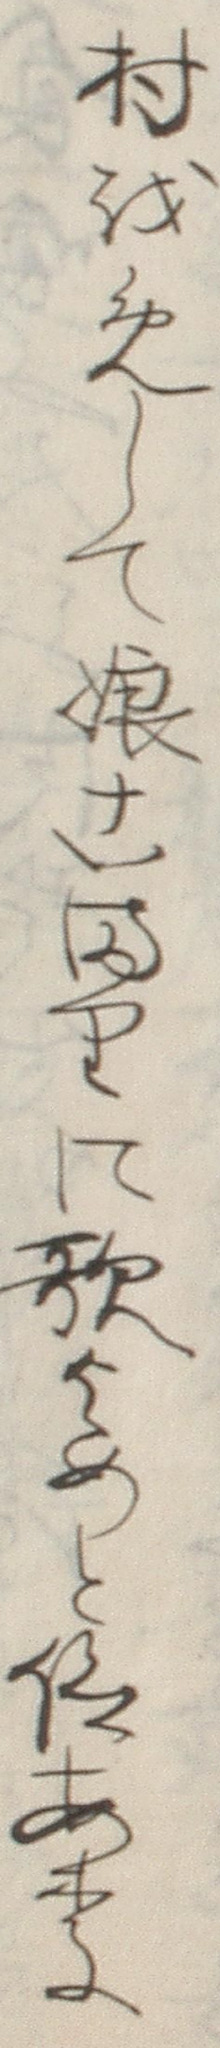村をめして娘こまりに歌よめと仰あり
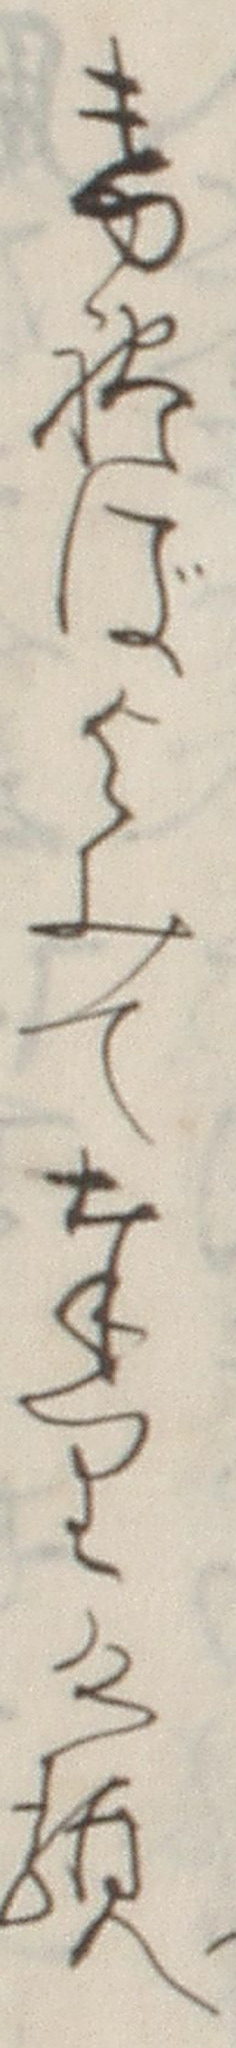ければよみて奉りける

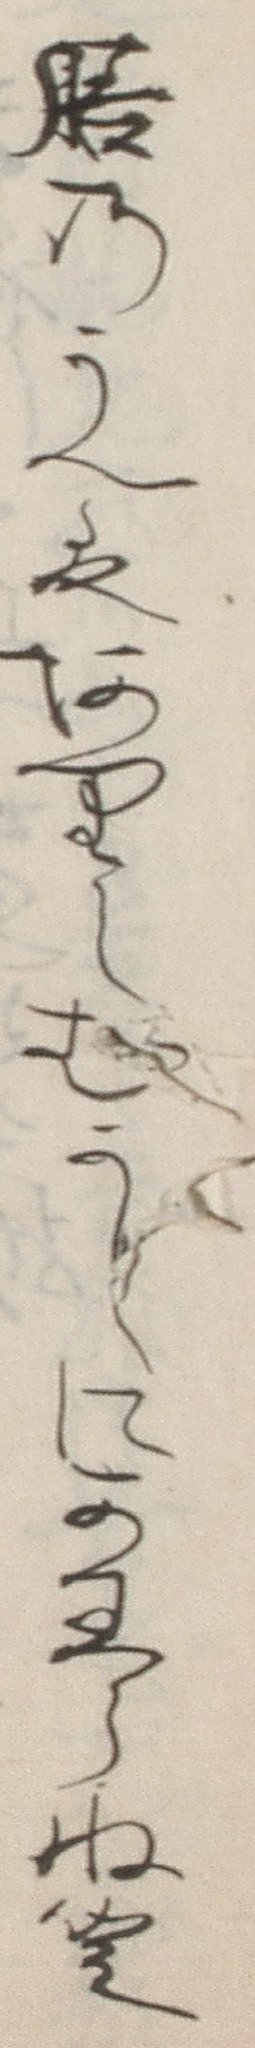膳のうへはありしむかしにかわらねと
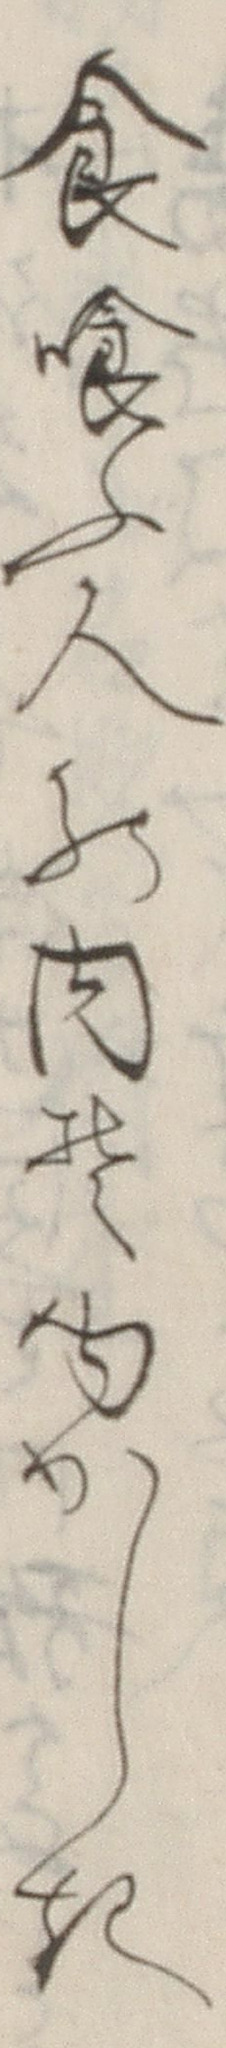食喰ふ人の内そゆかしき
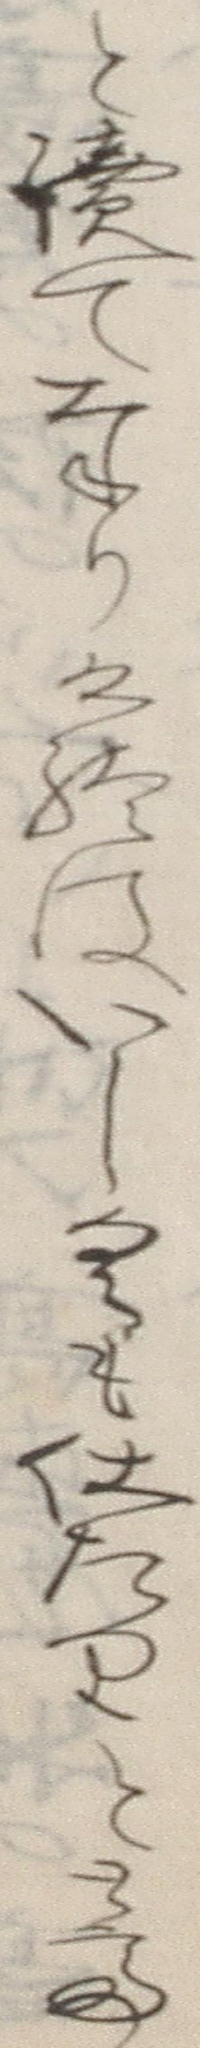と続て奉り御終はいしくも仕たりとヲて
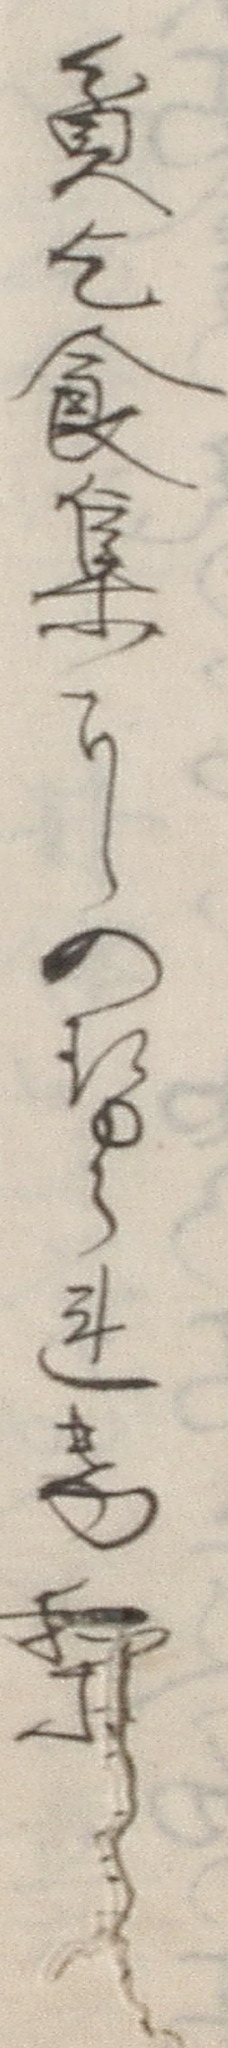貧乞食集にの替られて我等
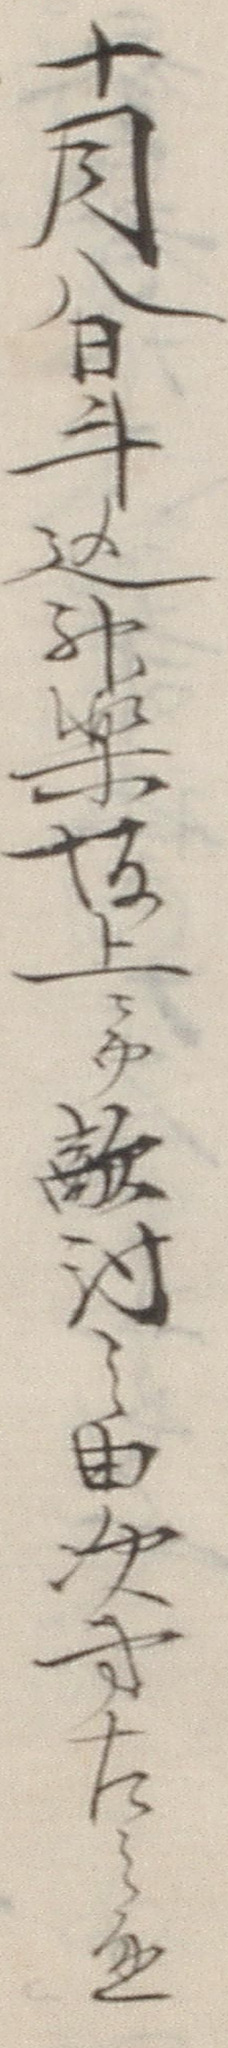十月八日牛込神楽坂上ニ而敵討之由次第左之通
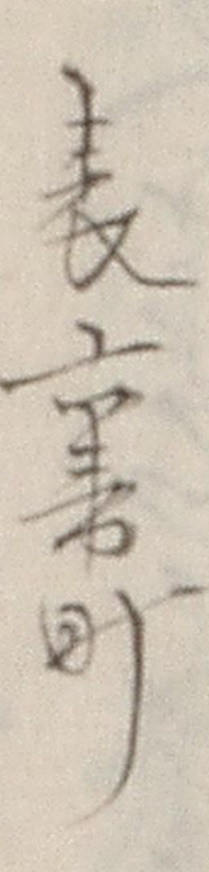表裏町
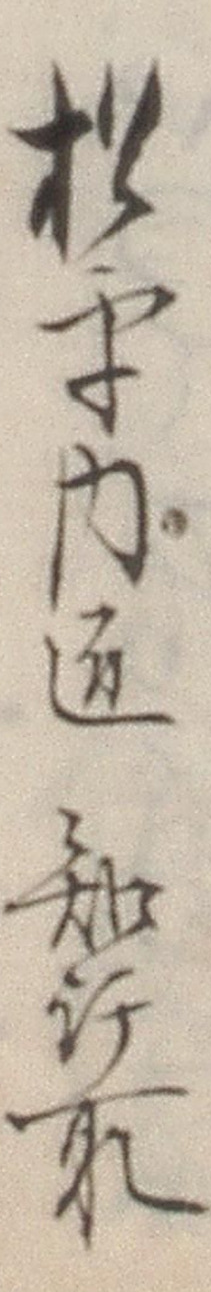松平内匠知行所
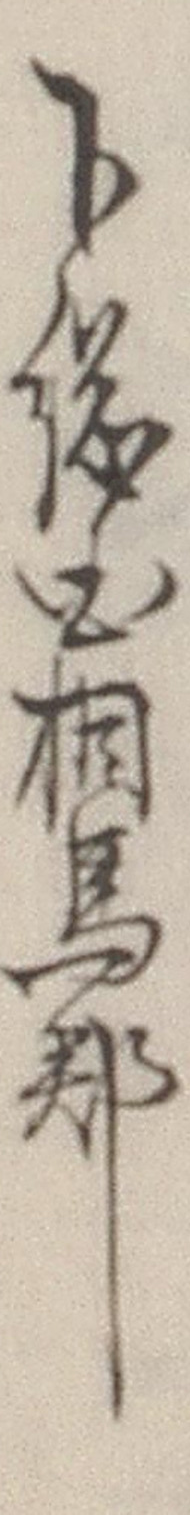下総国相鳥郡
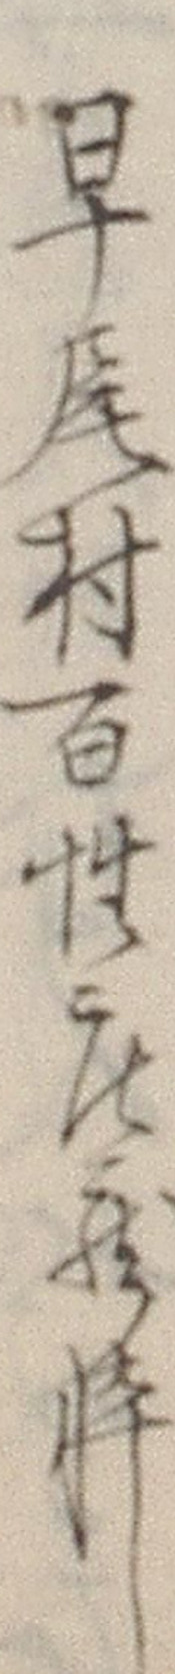早尾村百姓庄蔵倅
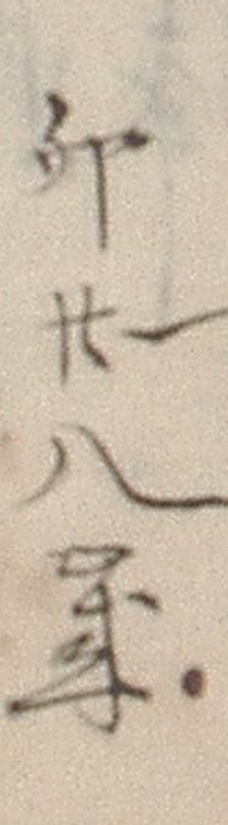卯廿八歳
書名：[諸国災害記録]
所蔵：東京大学地震研究所図書室 Earthquake Research Institute Library, The University of Tokyo, JAPAN
